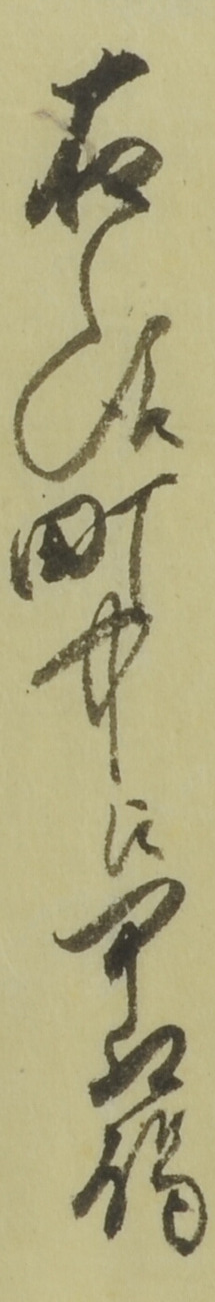右之趣町中江可相触
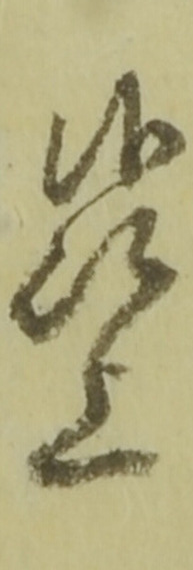候以上
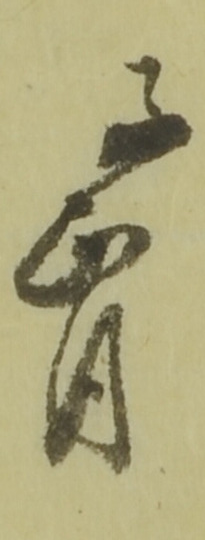子正月
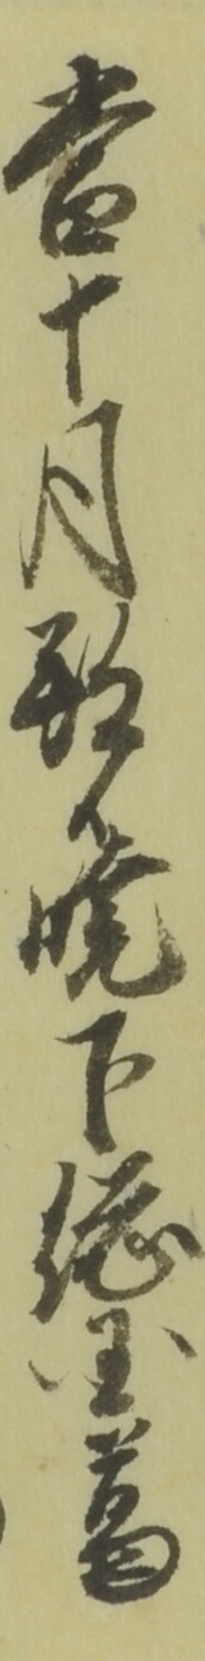当十月朔日暁下総国葛
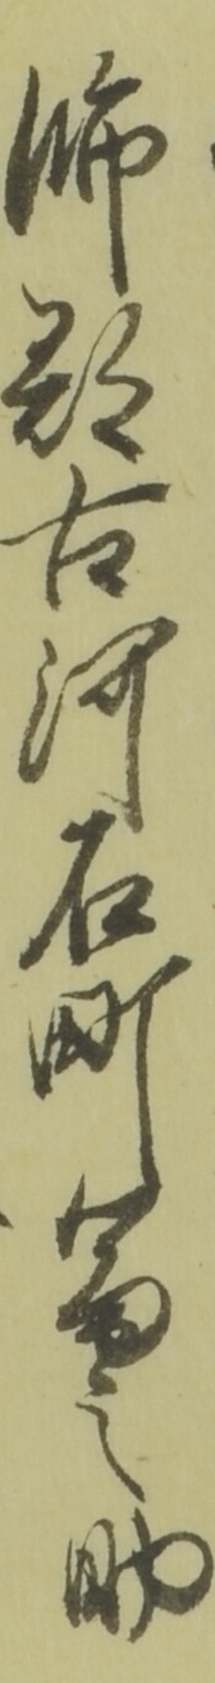飾郡古河石町冨之助
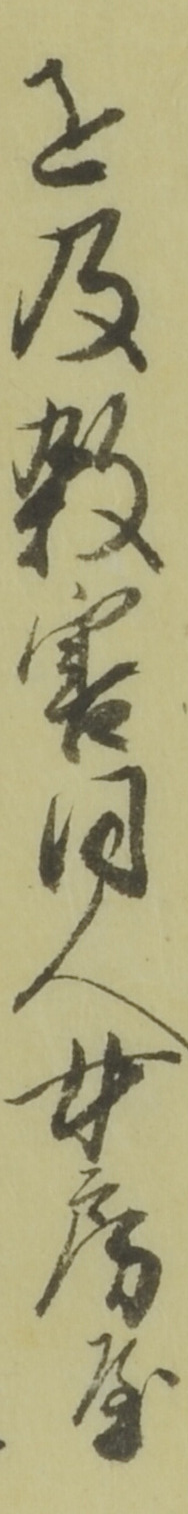を及殺害同人女房屋
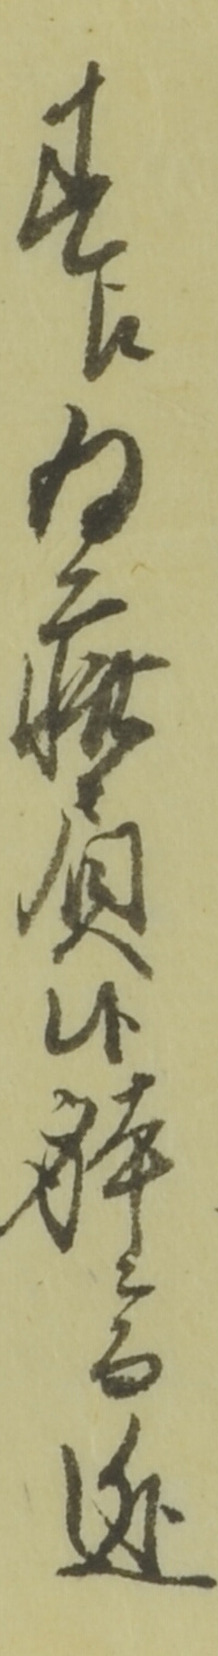春江為疵負候体ニ而逃
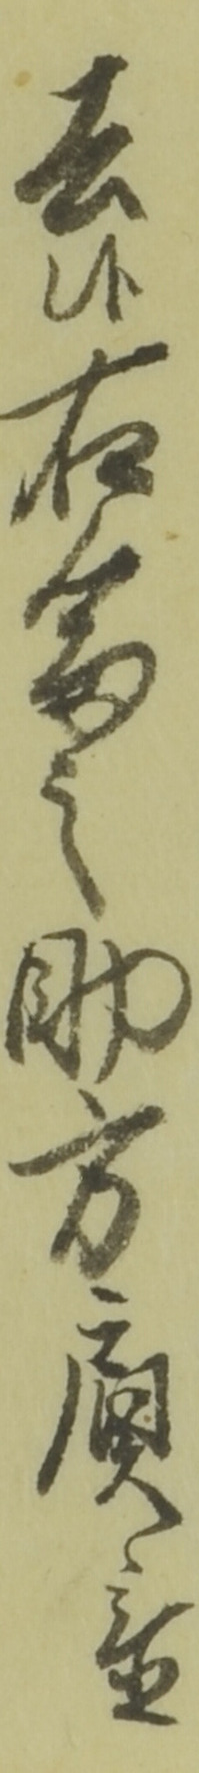去候右冨之助方負置
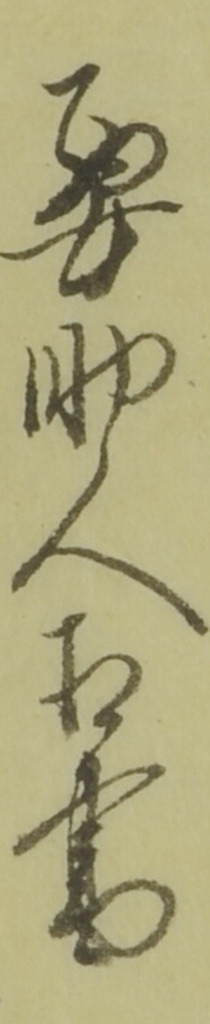要助人相書
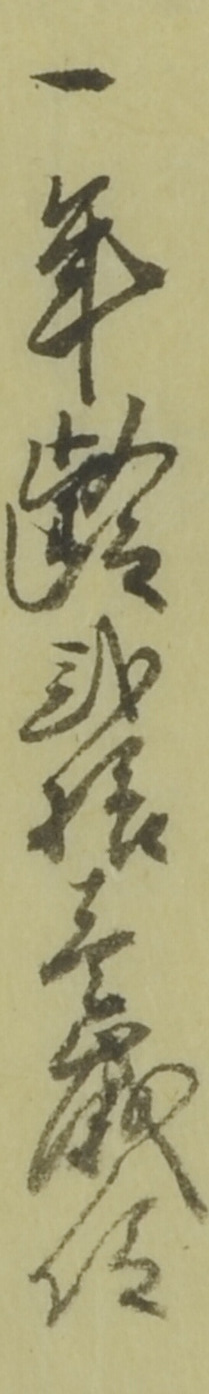一年齢弐拾壱歳位

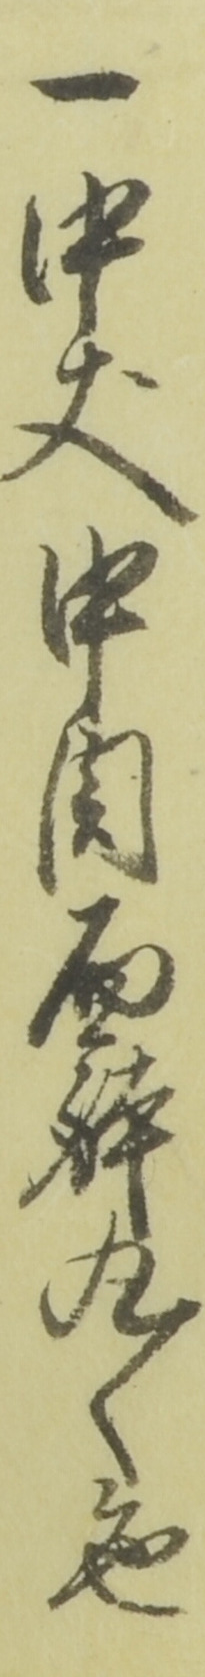一中丈中肉面体丸く色
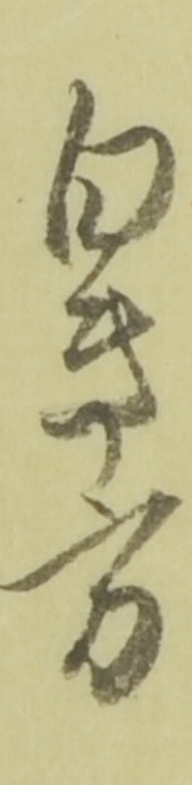白き方
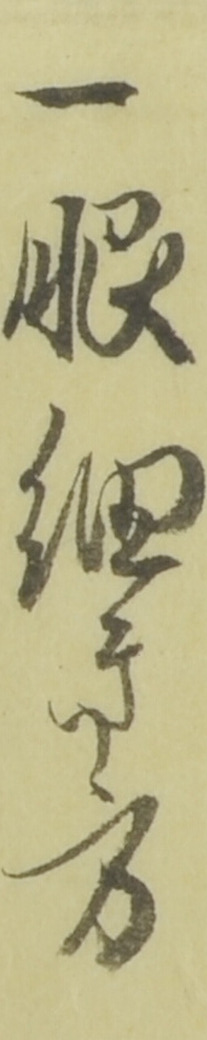一脇細き方
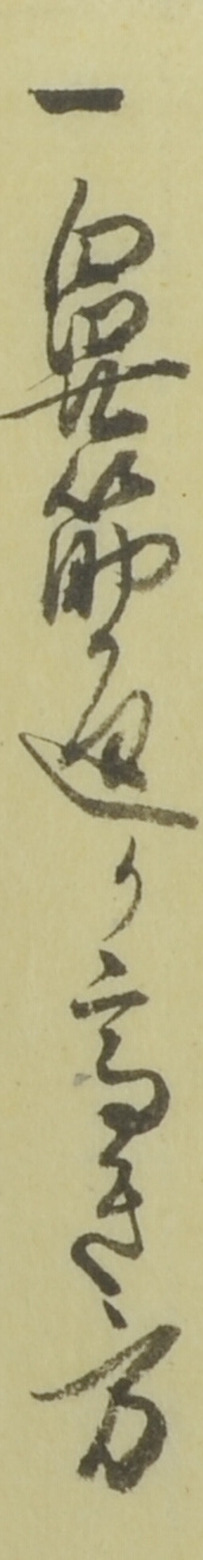一鼻筋通り高き方
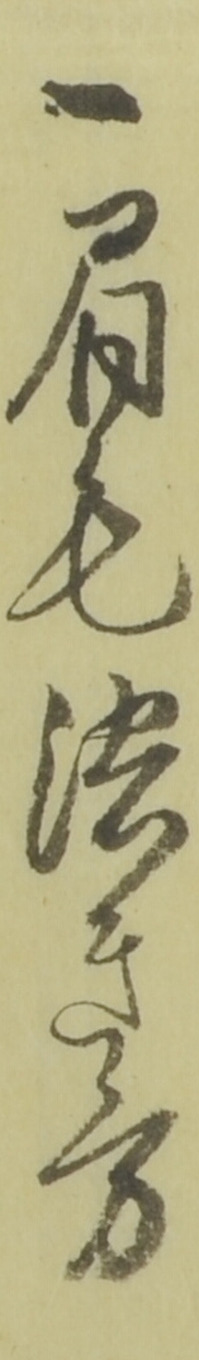一眉毛濃き方
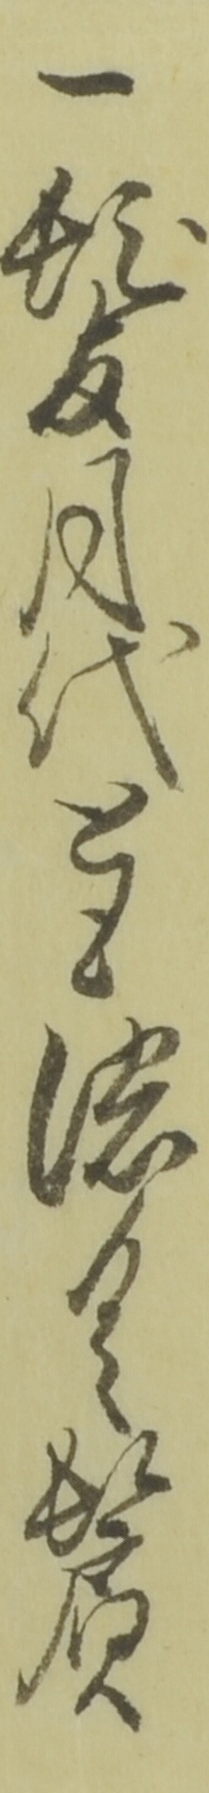一髪月代とも濃く鬢
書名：御触書御書附控
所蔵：伊那市立高遠町図書館・合同会社AMANE
